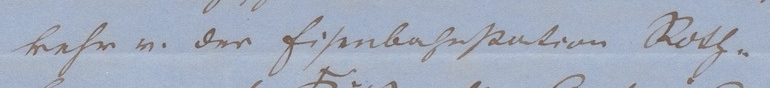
kehr v. der Eisenbahnstation Roth-
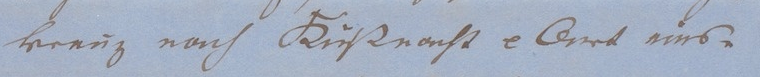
kreuz nach Küßnacht & Art eins-
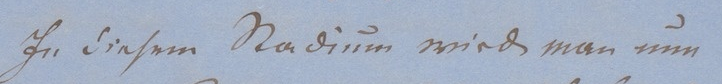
In diesem Stadium wird man nun
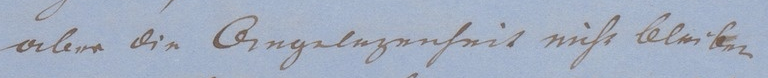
aber die Angelegenheit nicht bleiben
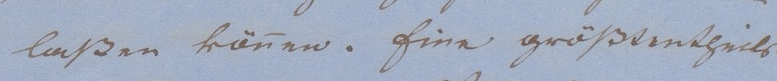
laßen können. Eine größtentheils
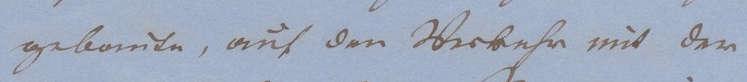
gebaute, auf den Verkehr mit der
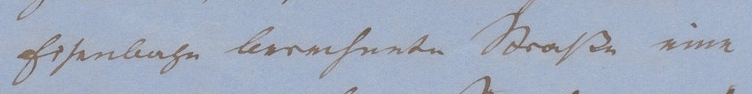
Eisenbahn berechnete Straße eine
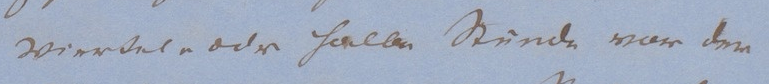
Viertel– oder halbe Stunde von der
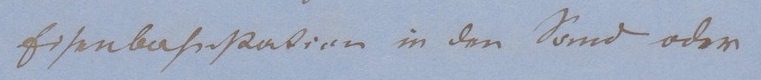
Eisenbahnstation in den Sand oder
